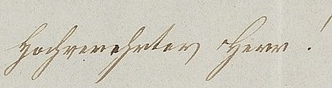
Hochverehrter Herr!
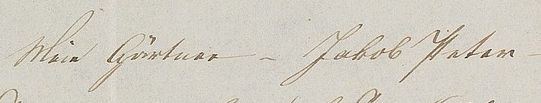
Mein Gärtner – Jakob Peter –
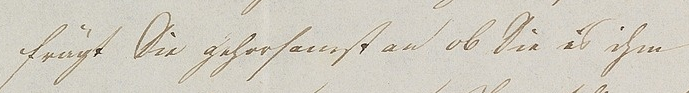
frägt Sie gehorsamst an ob Sie es ihm
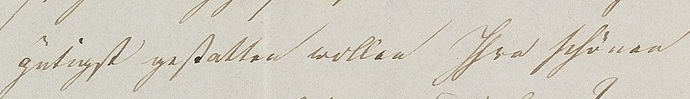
gütigst gestatten wollen Ihre schönen
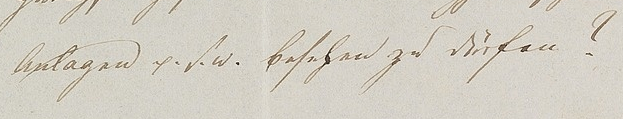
Anlagen u. s. w. besehen zu dürfen?
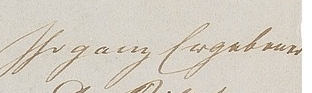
Ihr ganz Ergebener
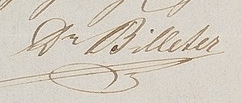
Dr Billeter
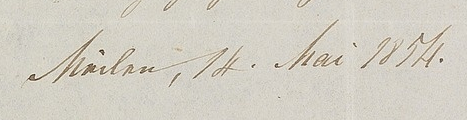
Meilen, 14. Mai 1854.
